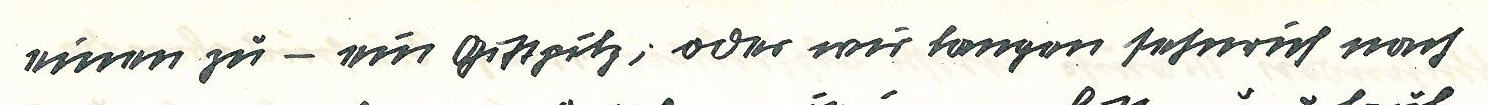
einen zu – ein Giftpilz; oder wir langen sehnrich nach
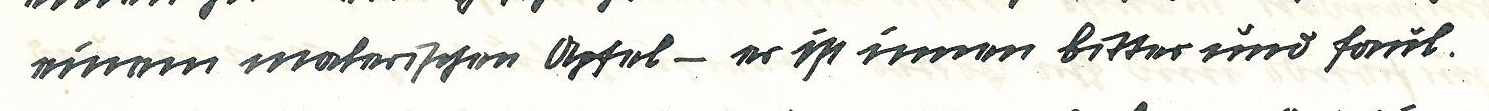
einem malerischen Apfel – er ist innen bitter und faul.
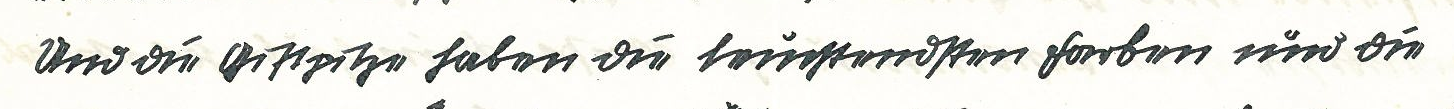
Und die Giftpilze haben die leuchtendsten Farben und die
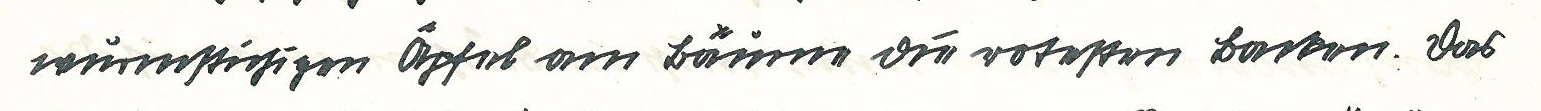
wurmstichigen Äpfel am Beaume die rotesten Backen. Das
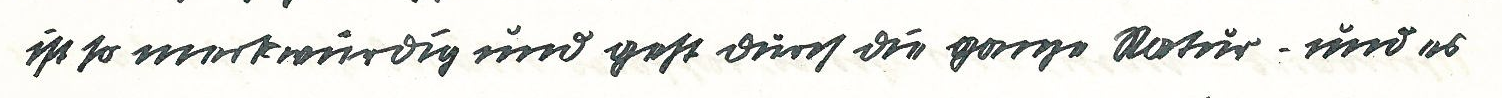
ist so merkwürdig und geht durch die ganze Natur – und es
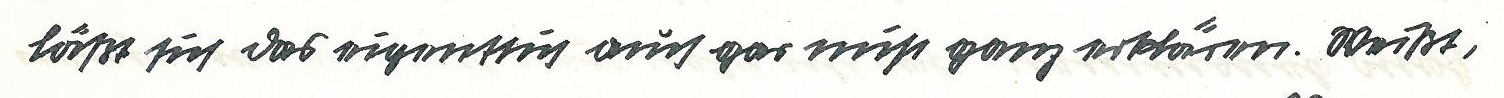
läßt sich das eigentlich auch gar nicht ganz erklären. Weißt,
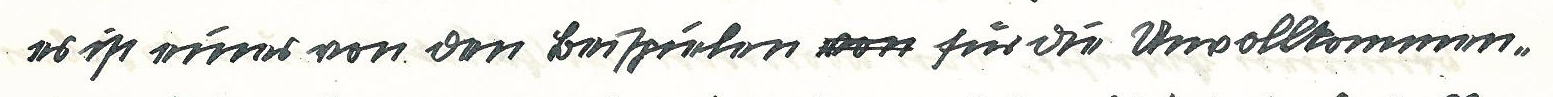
es ist eines von den Beispielen von für die Unvollkommen¬
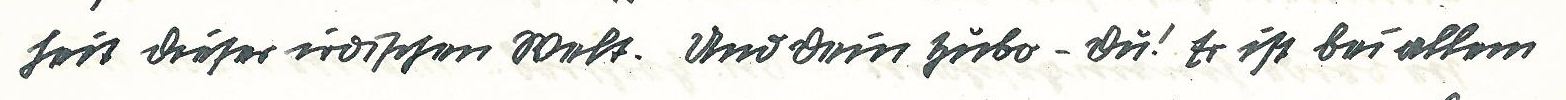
heit dieser irdischen Welt. Und Dein Hubo – Du! Er ist bei allem
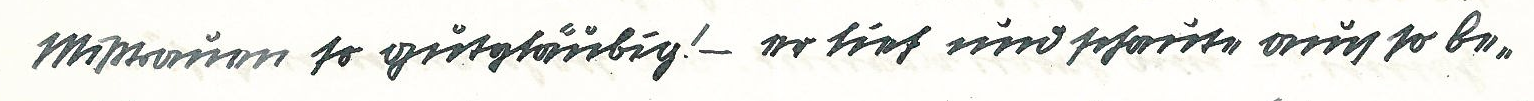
Mißtrauen so gutgläubig! – er lief und schaute auch so be¬
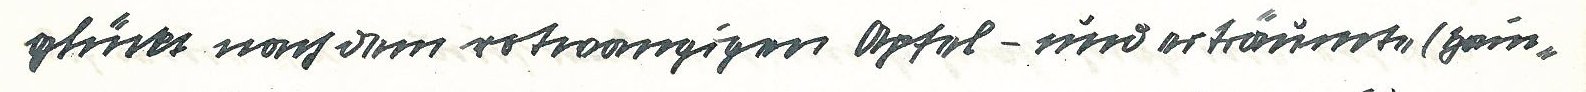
glückt nach dem rotwangigen Apfel – und er träumte (H.
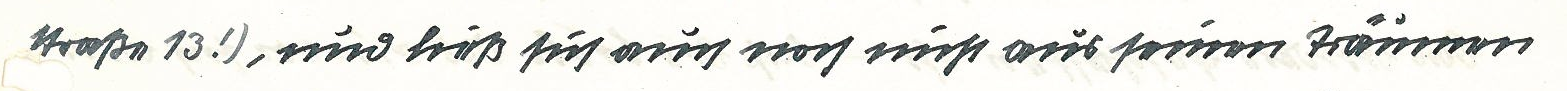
straße 13!), und ließ sich auch noch nicht aus seinen Träumen
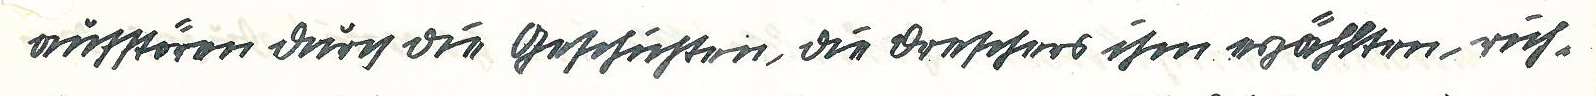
aufstören durch die Geschichten, die D.s ihm erzählten, rich¬
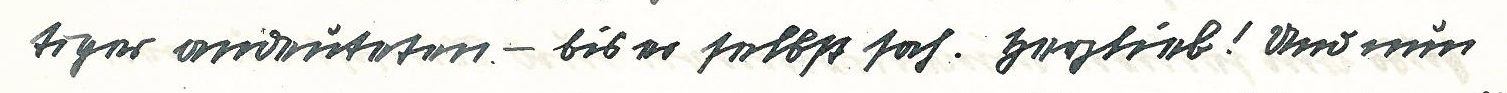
tiger andeuteten – bis er selbst sah. Herzlieb! Und nun
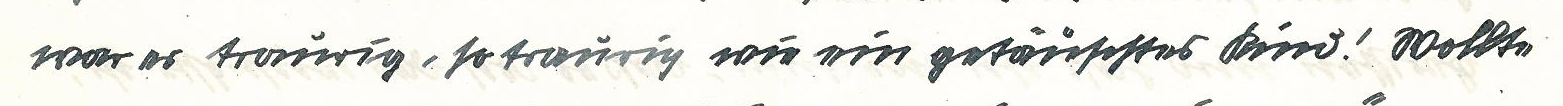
war er traurig, so traurig wie ein getäuschtes Kind! Wollte
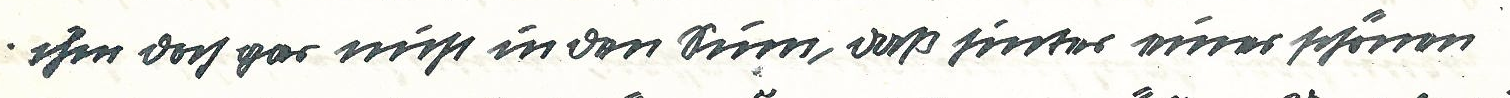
ihm doch gar nicht in den Sinn, daß hinter einer schönen
